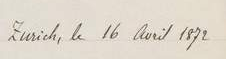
Zurich, le 16 Avril 1872
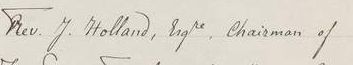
Trev. J. Holland, Esqre Chairman of
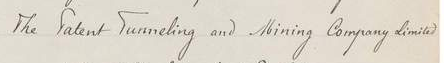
The Patent Tunneling and Mining Company Limited
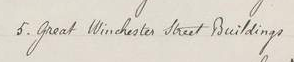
5. Great Winchester Street Buildings
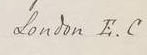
London E. C
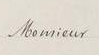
Monsieur
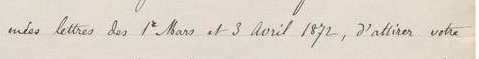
mées lettres des 1r Mars et 3 Avril 1872, d'attirer votre
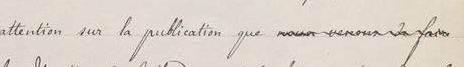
attention sur la publication que nous venons de faire
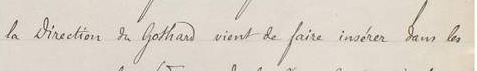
la Direction du Gothard vient de faire insérer dans les
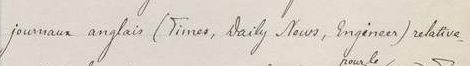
journaux anglais (Times, Daily News, Engineer) relative-
